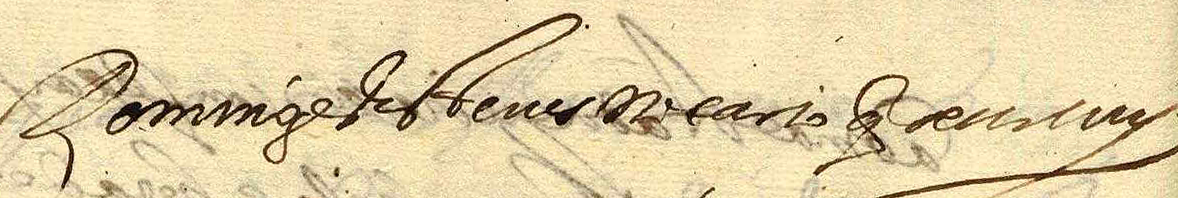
Domingos Esteues notario q̄ o escreuy
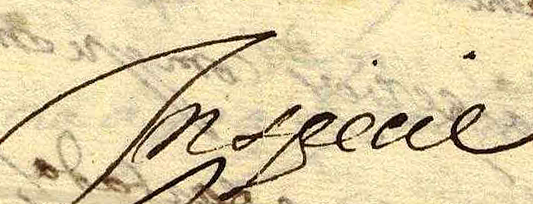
Jn specie
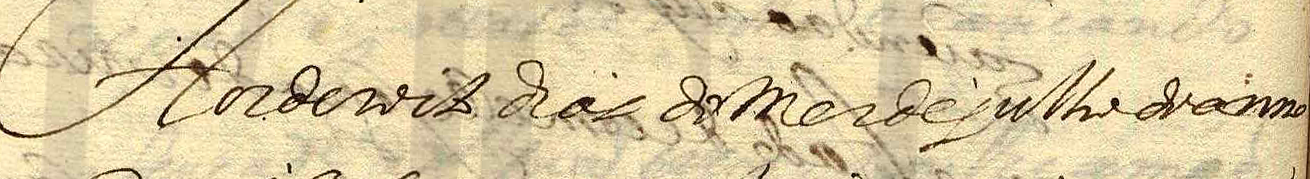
Aos dezoito dias do mez de julho do anno
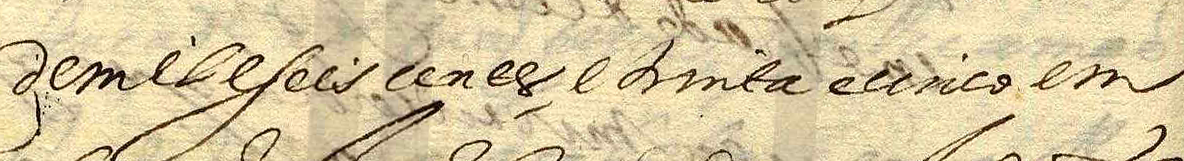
de mil e seiscentos, e trinta e cinco em
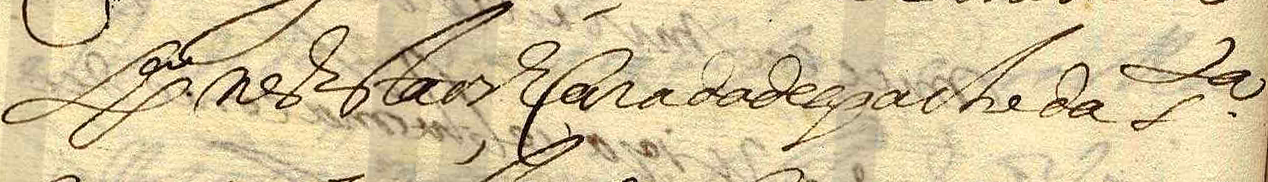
Lxa nos Estaos, E Caza do despacho da sta.
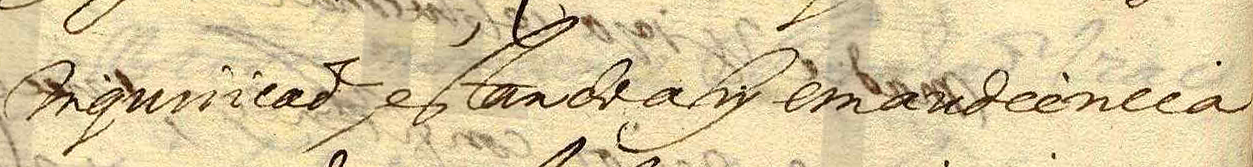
Inquisiçaõ, estando ahy em audiencia
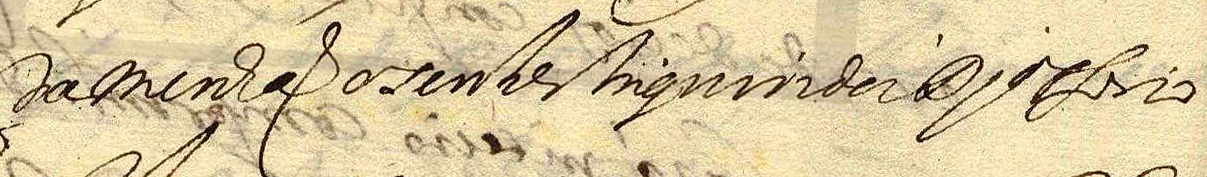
da menhā o senhor Inquisidor Djo osorio
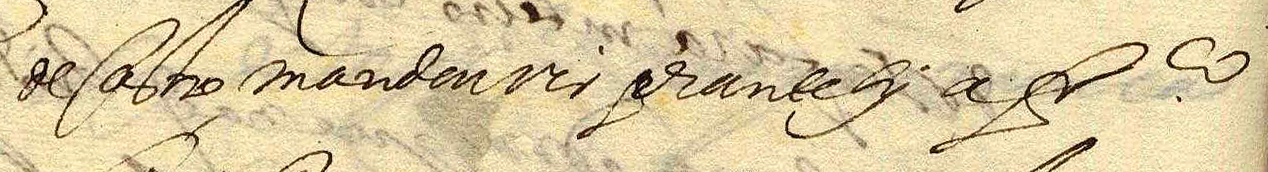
de Castro, mandou vir perante sy a fr.co
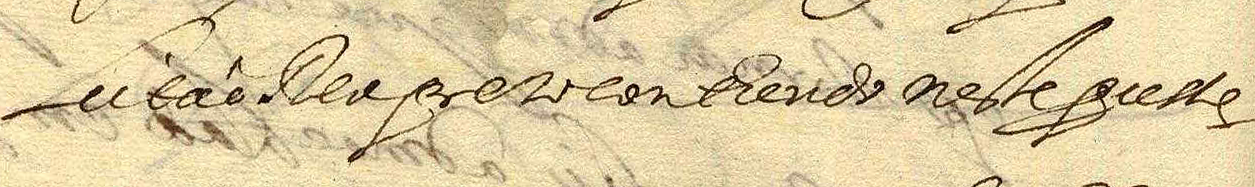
Leitaõ Reo prezo contheudo neste ꝓcesso
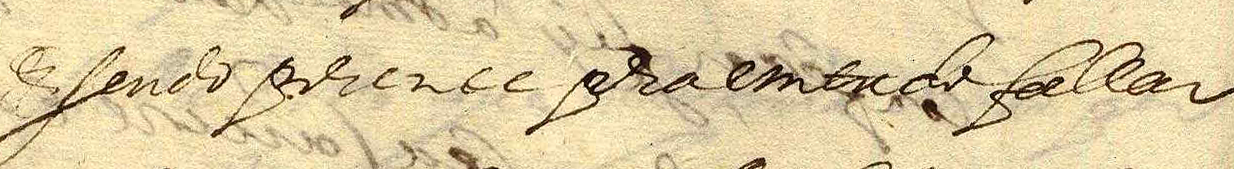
E sendo prezente pera em tudo fallar
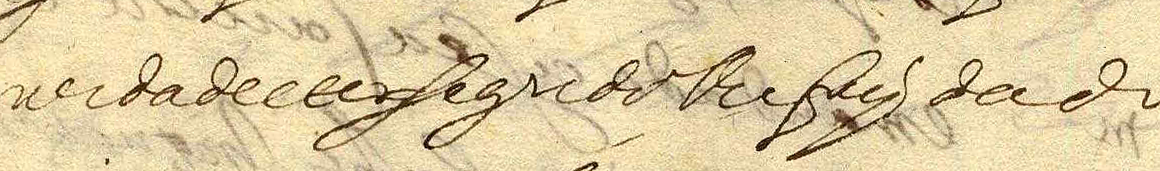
uerdade e ter segredo lhe foy dado
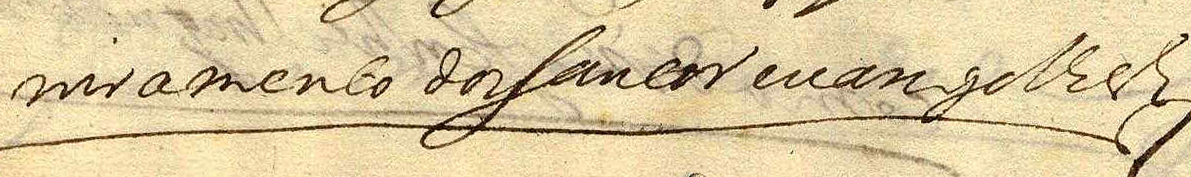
iuramento dos santos euangelhos
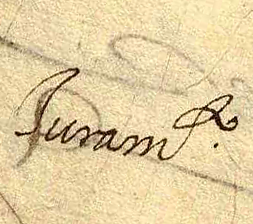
Iuramto.
